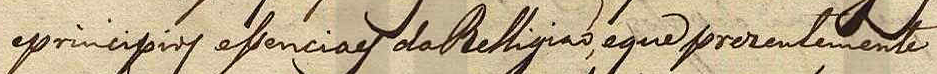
e principios essenciaes da Relligiaõ, e que prezentemente
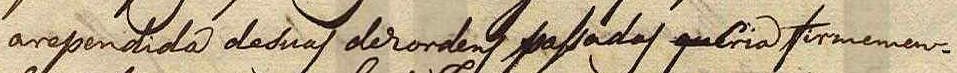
arependida de suas dezordens passadas quCria firmemen
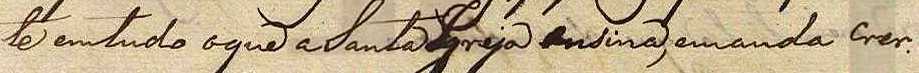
te em tudo o que a Santa Igreja ensina, e manda crer.
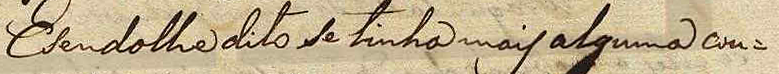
E sendolhe dito se tinha mais alguma cou
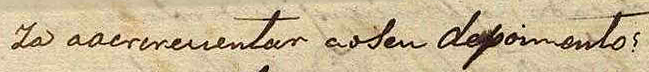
za a a acrerescentar ao seu depoimento?
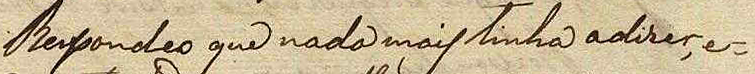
Respondeo que nada mais tinha a dizer, e
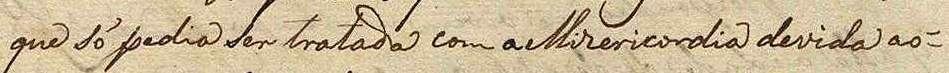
que só pedia ser tratada com a Mizericordia devida ao
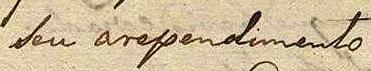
seu arependimento
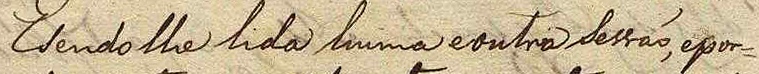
E sendolhe lida huma e outra Sessaõ, e por
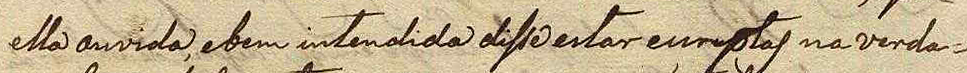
ella ouvida, e bem intendida disse estar escriptas na verda
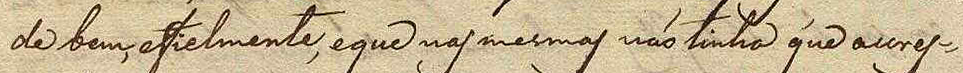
de bem, e fielmente, e que nas mesmas naõ tinha que acres
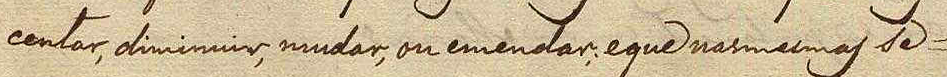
centar, diminuir, mudar, ou emendar; e que nas mesmas se
